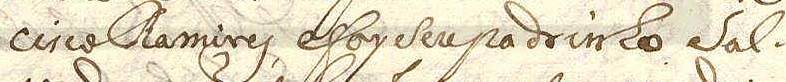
cisco Ramires, e foy seu padrinho Sal
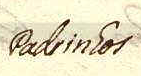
Padrinhos
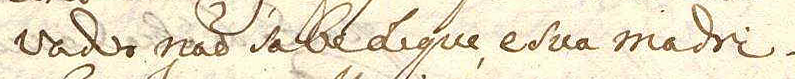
vador naõ sabe de que, e sua madri
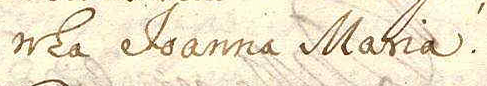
nha Ioanna Maria.
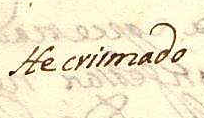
He crismado
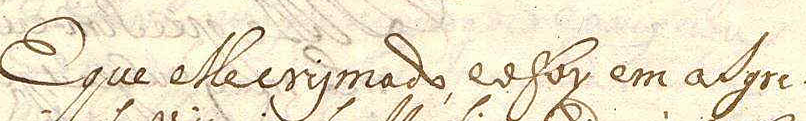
E que elle crismado, e o foy em a Igre
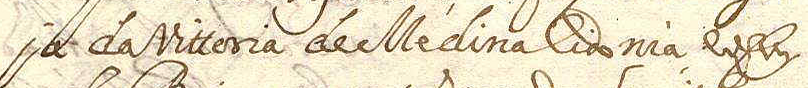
ja da Vittoria de Medina Cidonia, e o foy
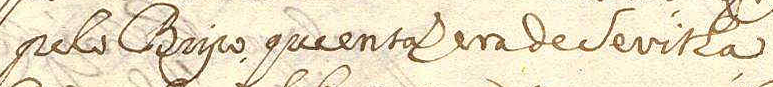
pelo Bispo, que entaõ era de Sevilha,
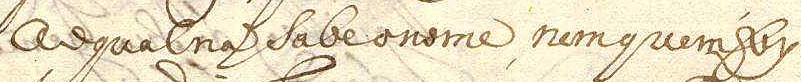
ao qual naõ Sabe o nome, nem quem foy
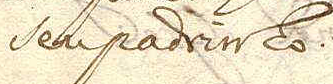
seu padrinho.
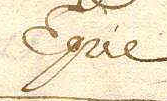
E que
